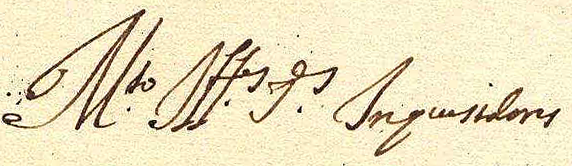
M.to Ill̄.es s.es Inquisidores
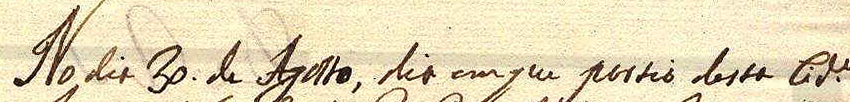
No dia 30. de Agosto, dia em que partio desta Cid.e
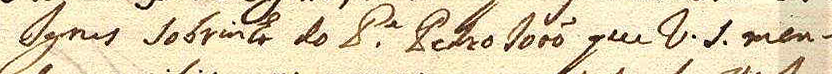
Ignes sobrinha do P.e Pedro Ioaõ que V. s. man
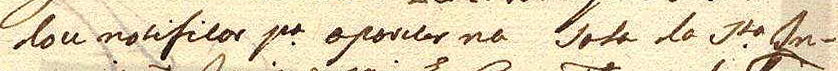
dou notificar p.a aparecer na sala da Sta In
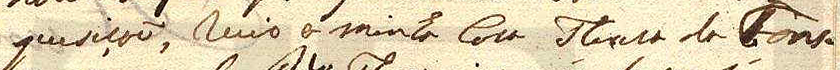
quisiçaõ, Veio a minha Caza Thereza da Fons
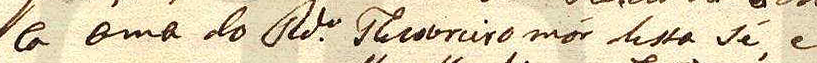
Ca ama do Rd.o Thezovreiro mór desta sé, e
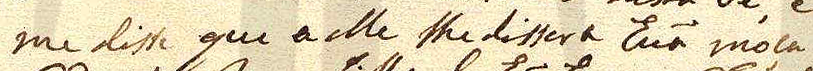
me disse que a elle lhe dissera huā moça
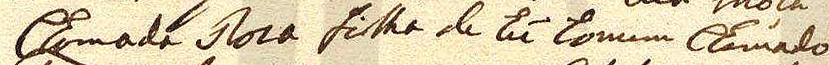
Chamada Roza filha de hū homem Chamado
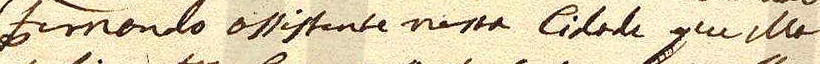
Fernando assistente nesta Cidade que ella
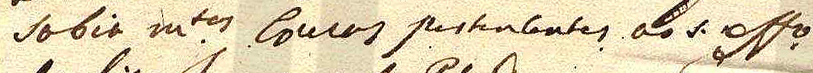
sabia mtas Couzas pertencentes do s. off.o
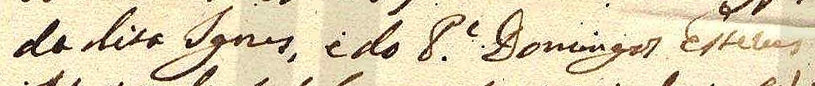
da dita Ignes, e do P.e Domingos Esteves
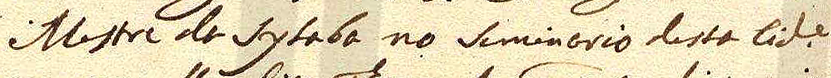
Mestre da Sylaba no seminario desta Cid.e
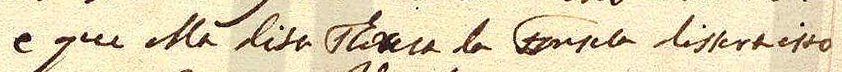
e que ella dita Thereza da Fonseca dissera isto
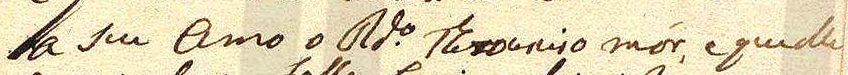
a seu Amo o Rd.o Theroureio mór, e que elle
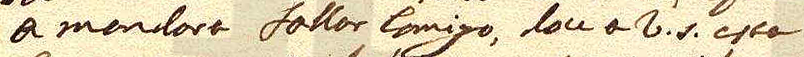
a mandara fallar Comigo, dou a V. s. esta
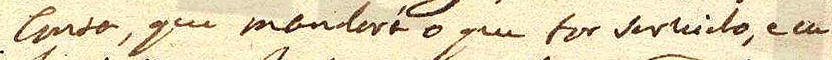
Conta, que mandará o que for seruido, e eu
